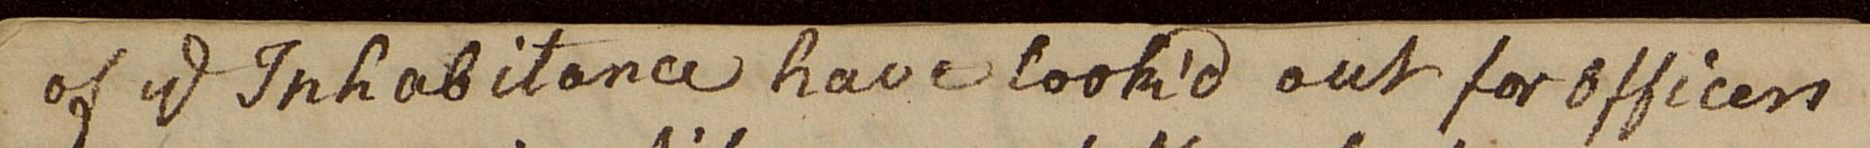of y^e Inhabitance have look'd out for Officers
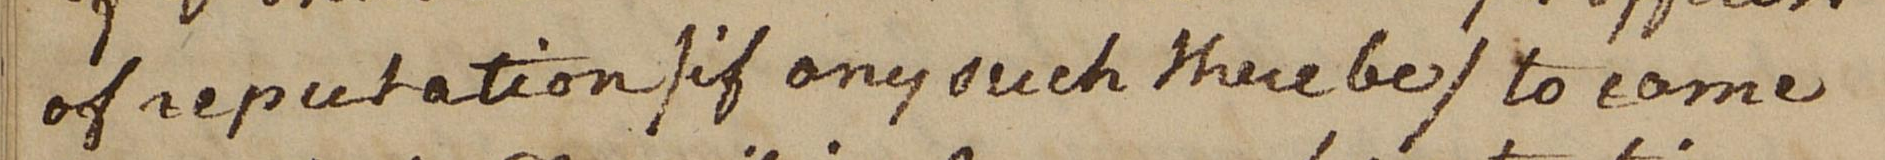of reputation /if any such there be/ to come
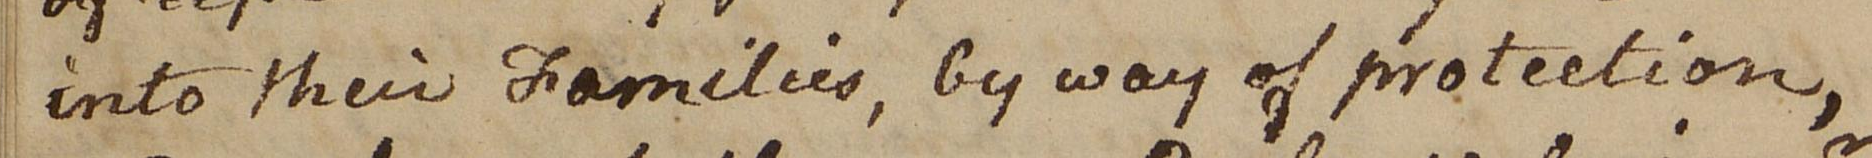into their Families, by way of protection.
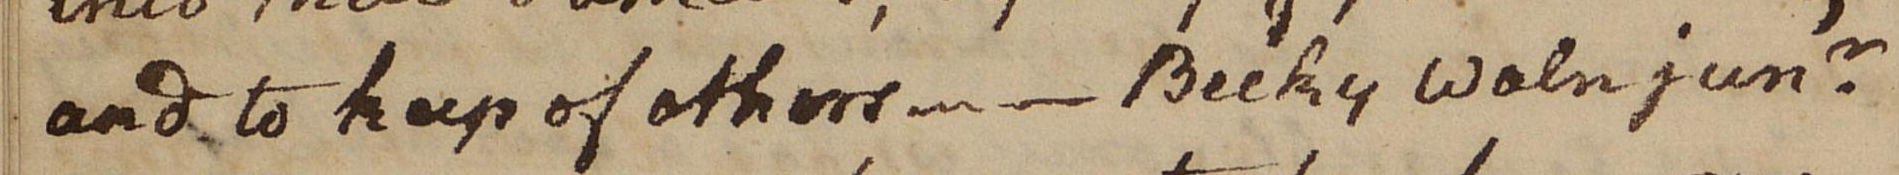and to keep of others-- Becky Waln jun^r.
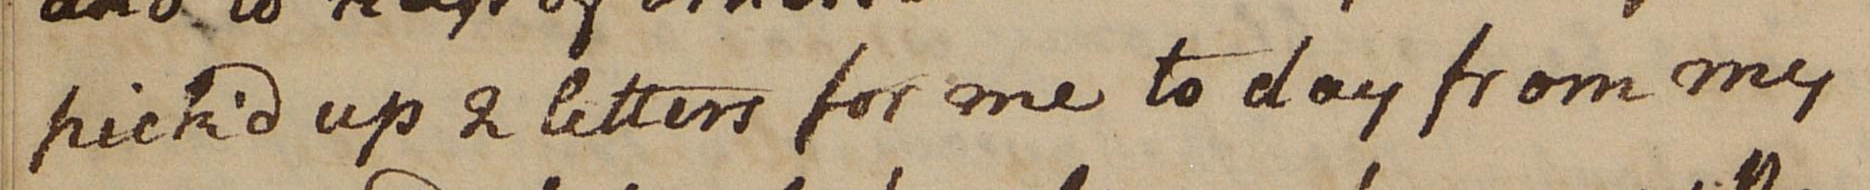pick'd up 2 letters for me to day from my
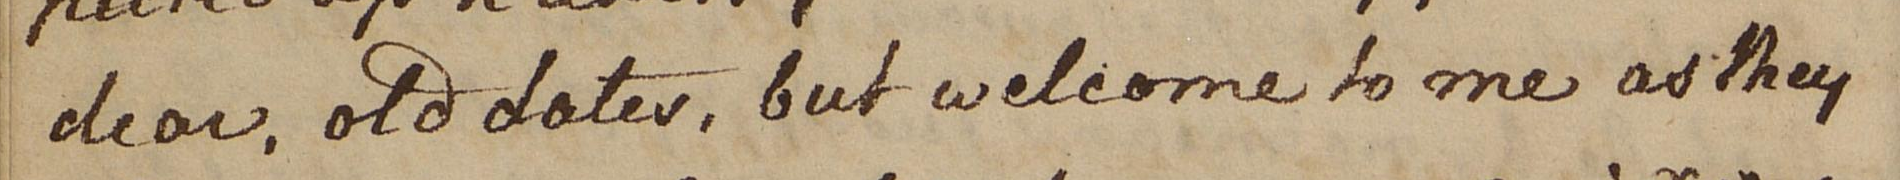dear, old dates, but welcome to me as they
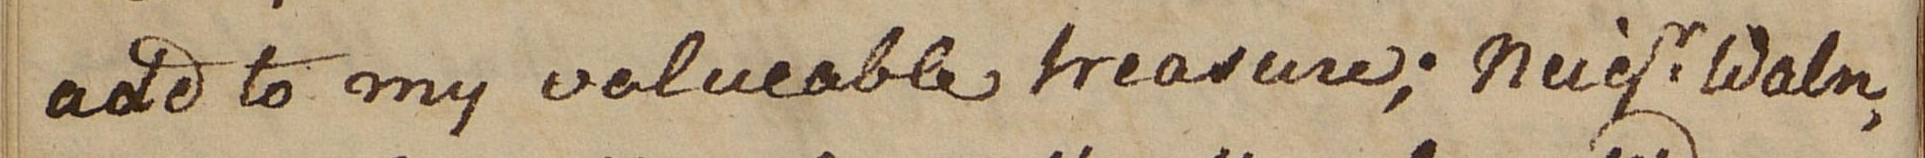add to my valueable treasure; Neig^r. Waln,
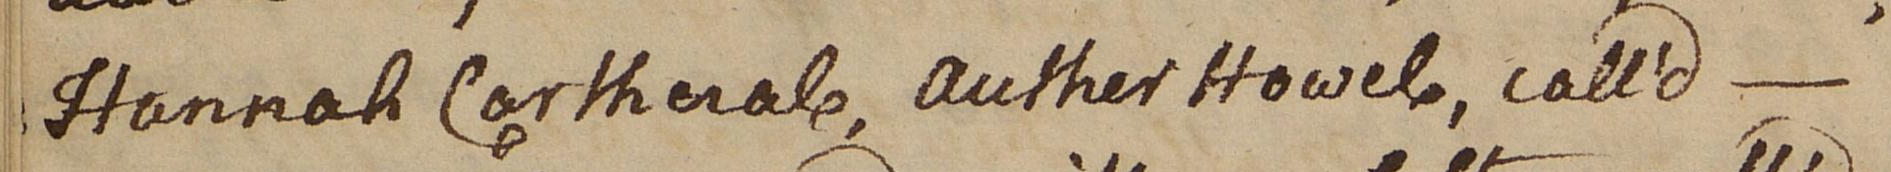Hannah Cartheral, Auther Howel, call'd-
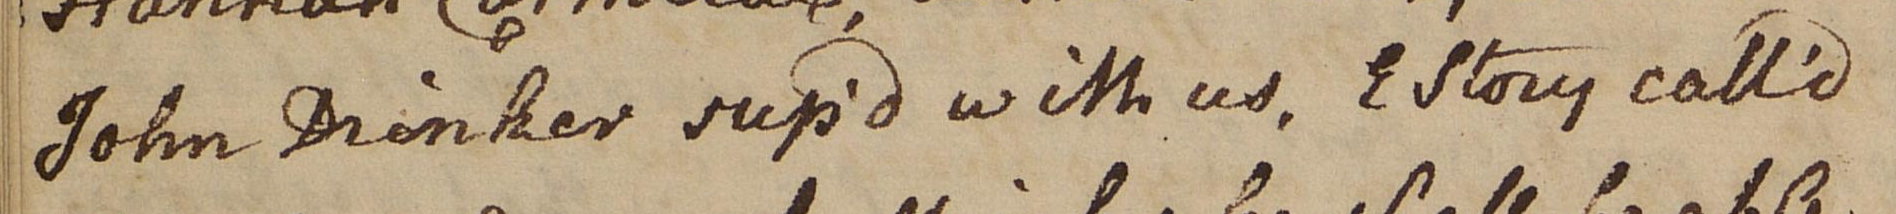John Drinker sup'd with us, E story call'd
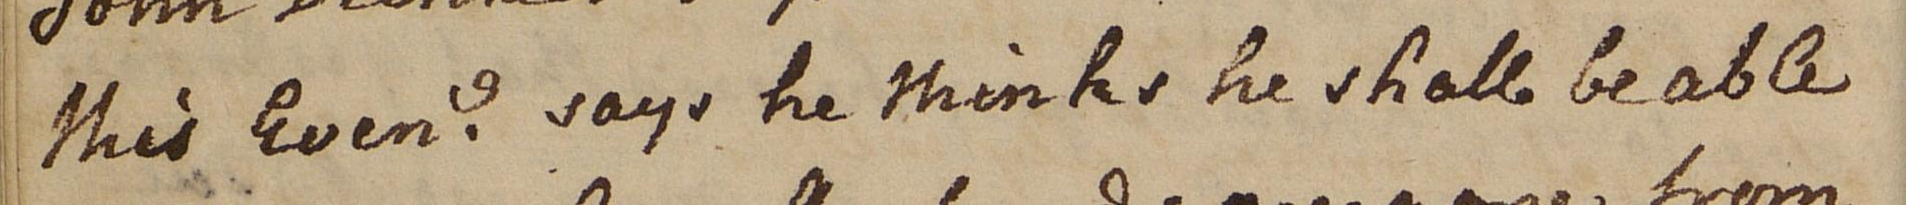this Even^g. says he thinks he shall be able
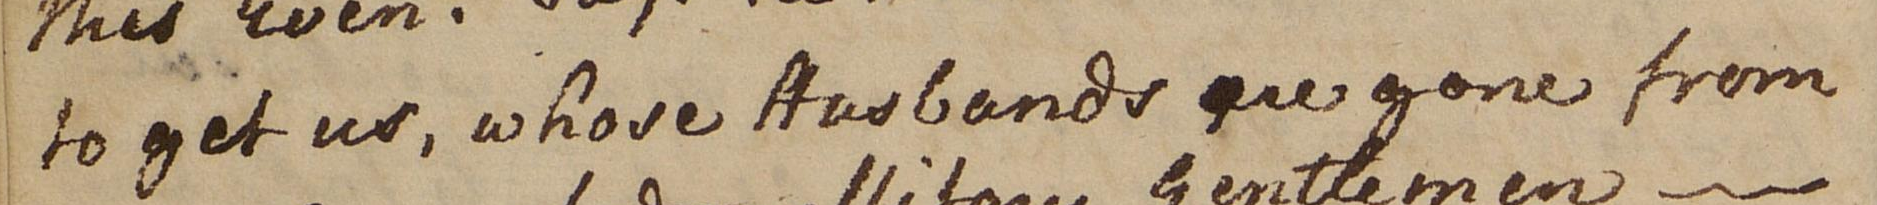to get us, whose Husbands are gone from
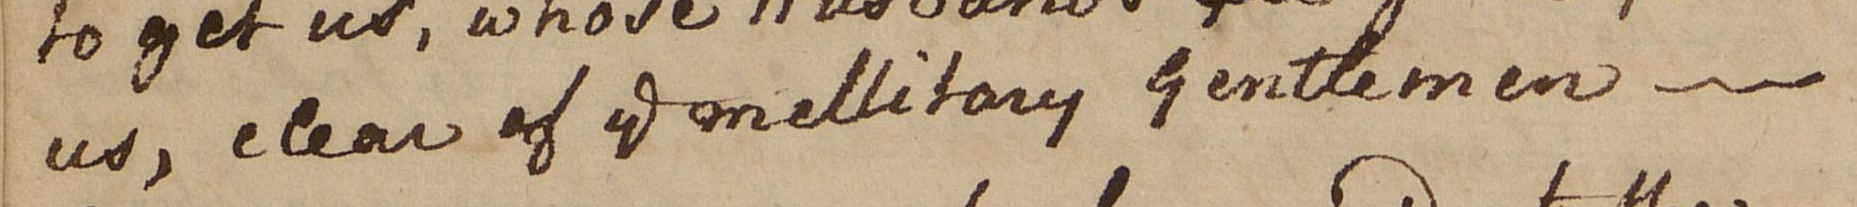us, clear of y^e mellitary Gentlemen-
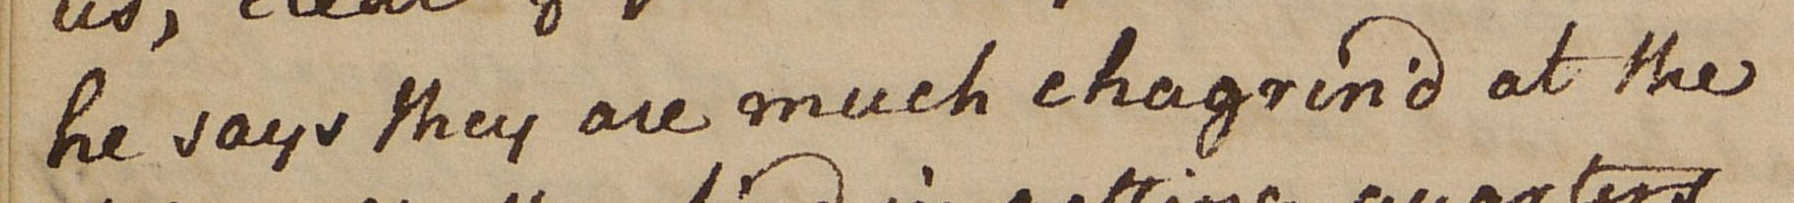he says they are much chagrin'd at the
